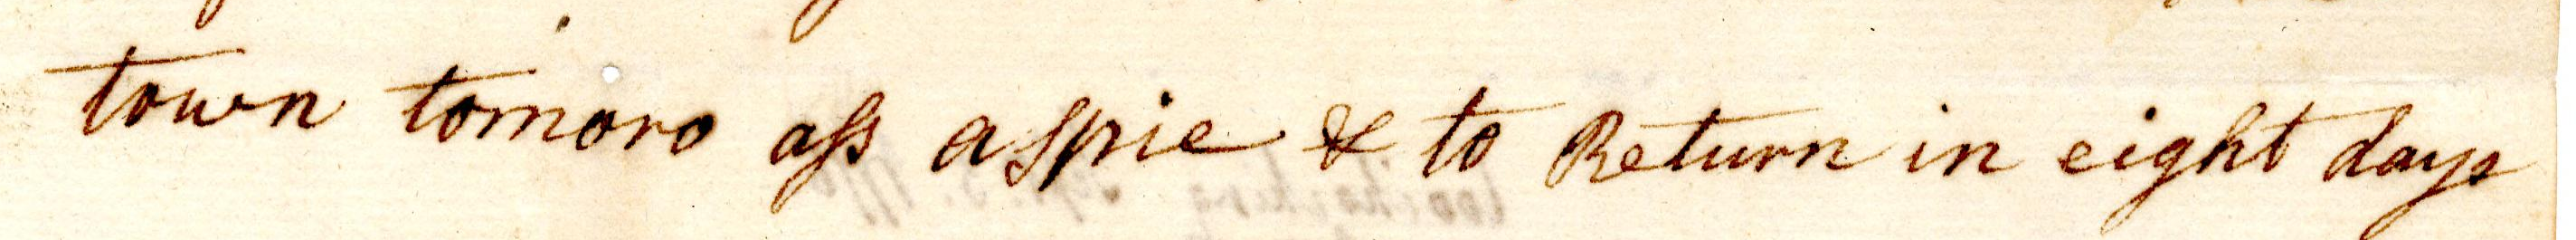town tomoro ass a spie & to Return in eight days
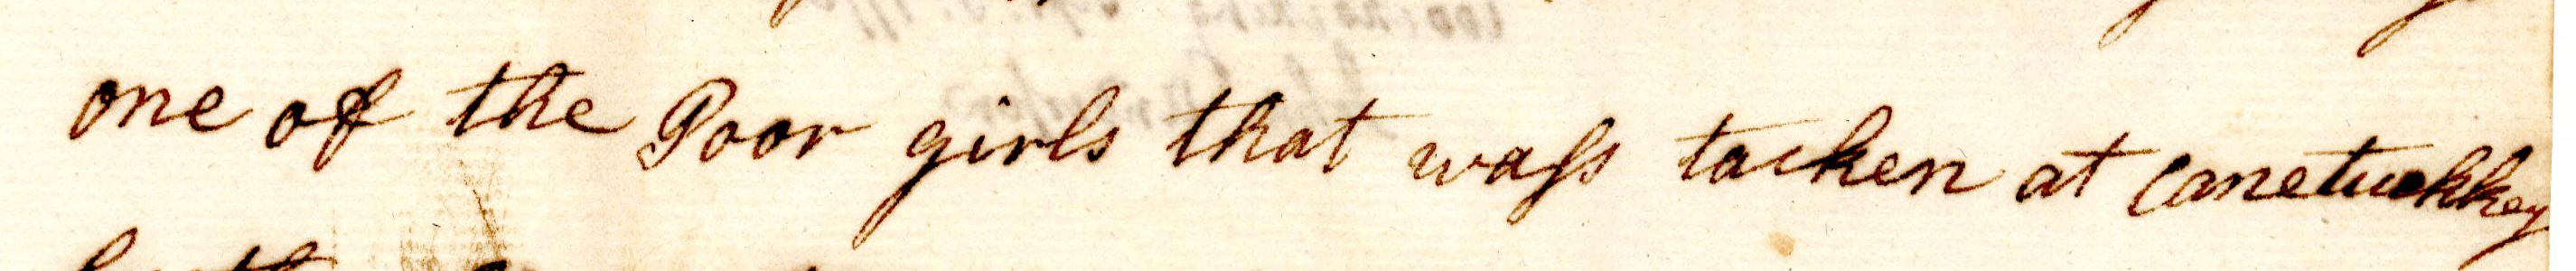one of the Poor girls that wass tacken at canetuckkey
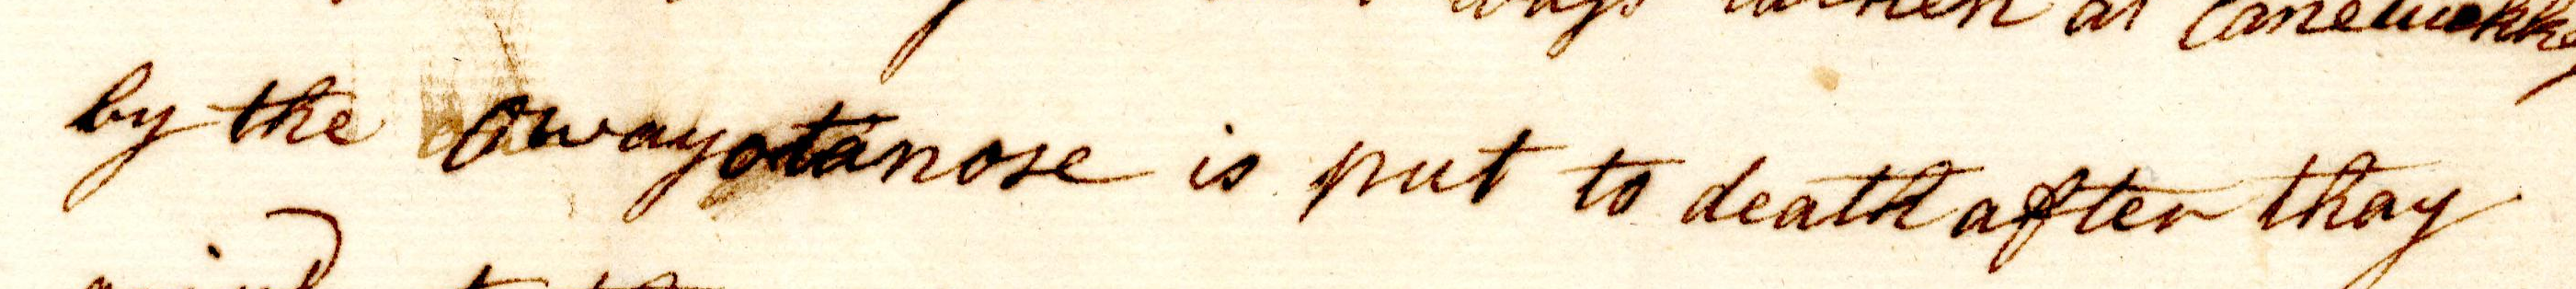by the owayotanose is put to death after thay
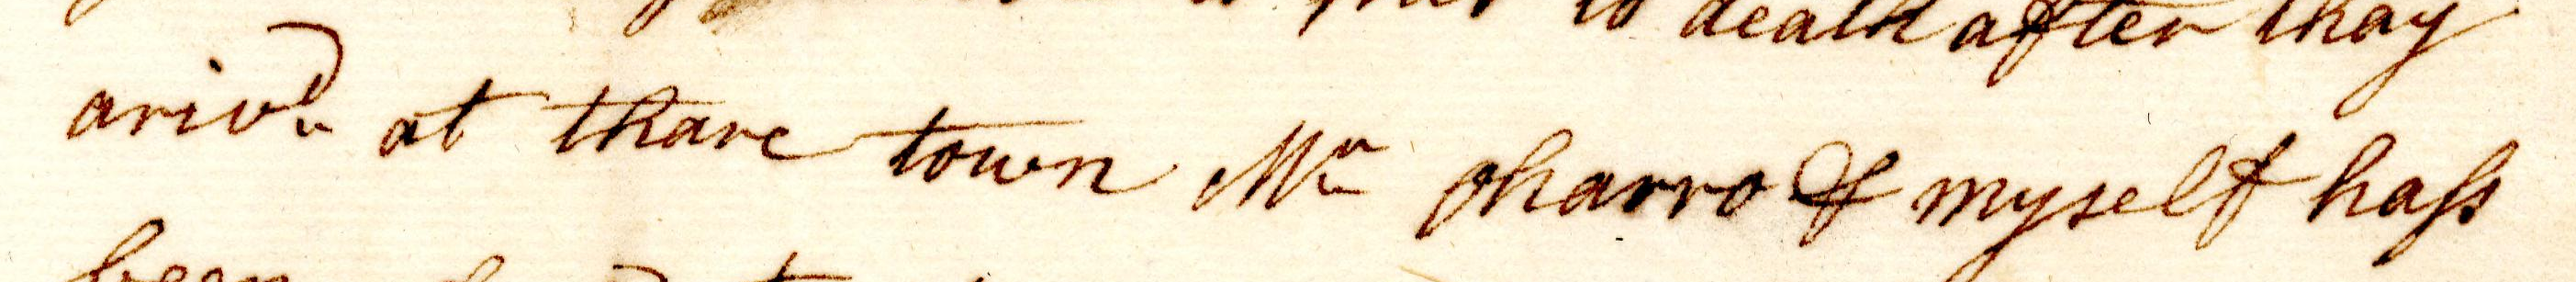ariv^d at thare town M^r Oharro & myself hass
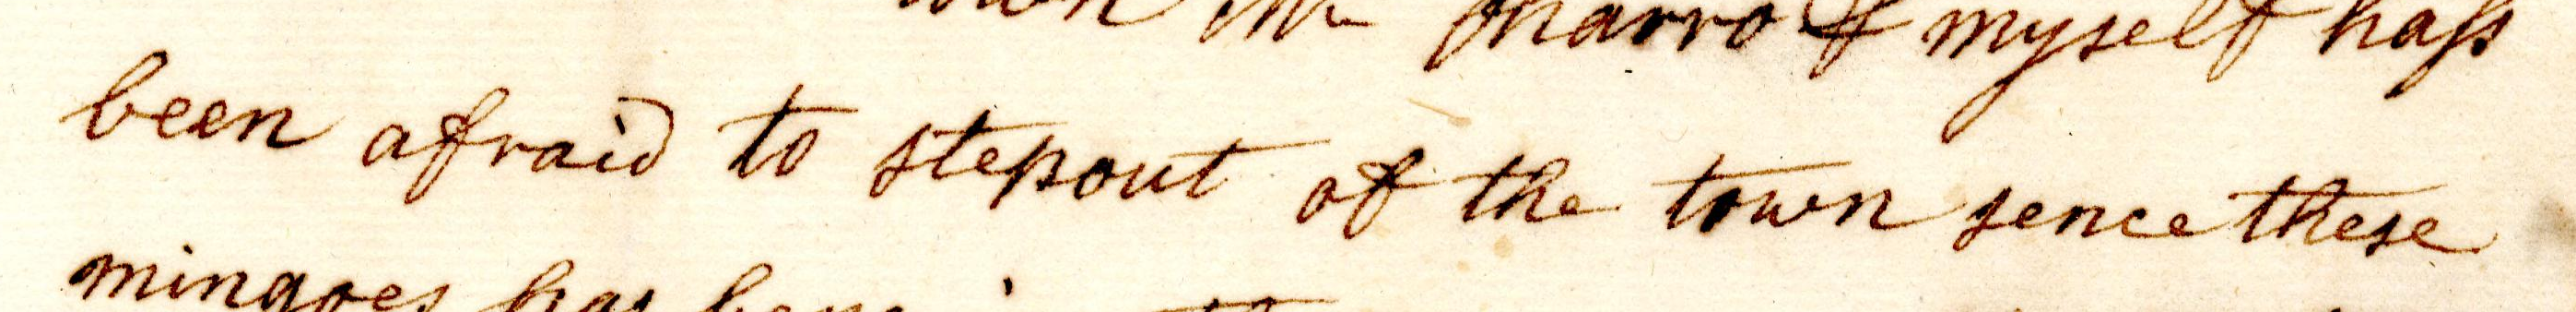been afraid to stepout of the town sence these
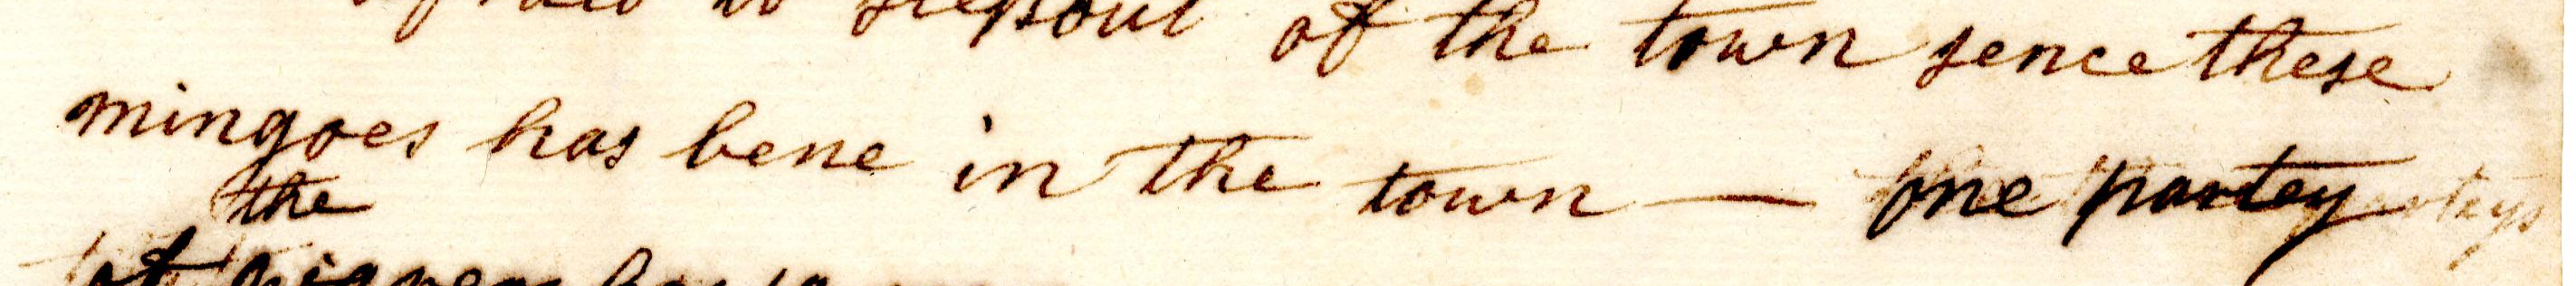mingoes has bene in the town- one partey
